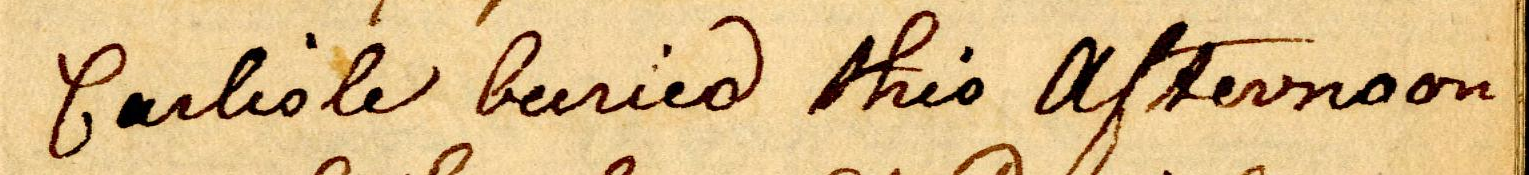Carlisle buried this Afternoon
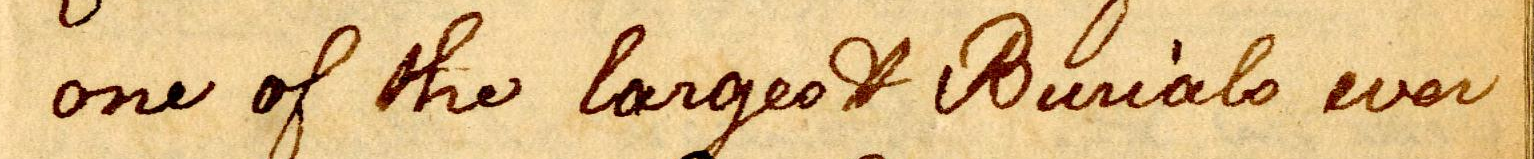one of the largest Burials ever
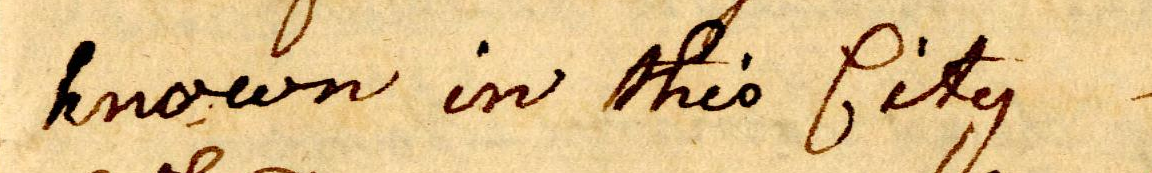known in this City
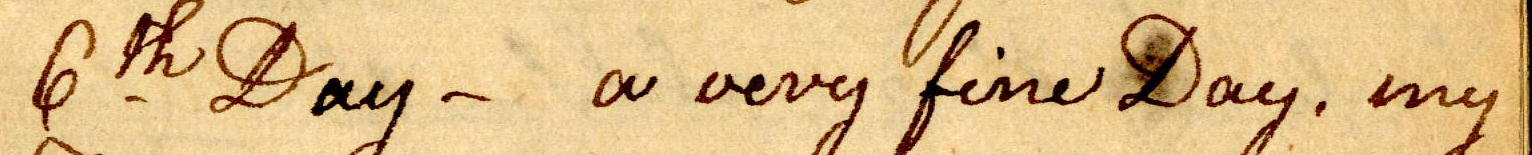6^th Day- a very fine Day. my
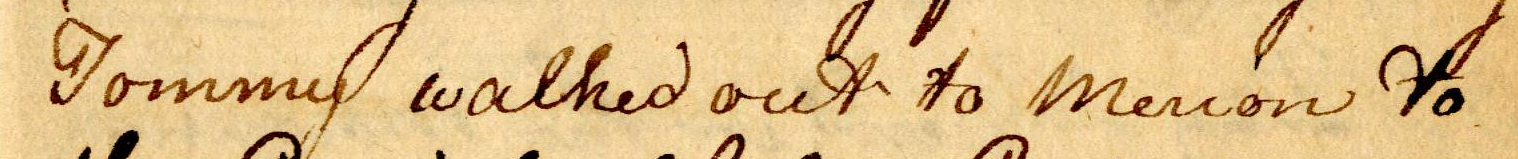Tommy walked out to Merion to
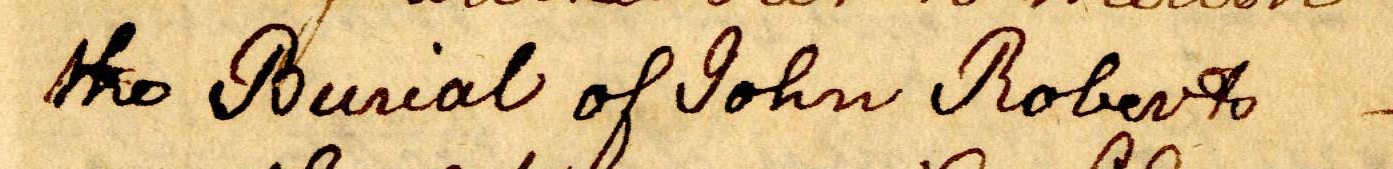the Burial of John Roberts
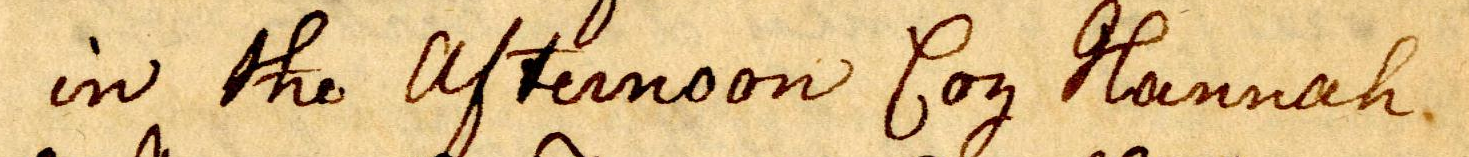in the Afternoon Coz Hannah
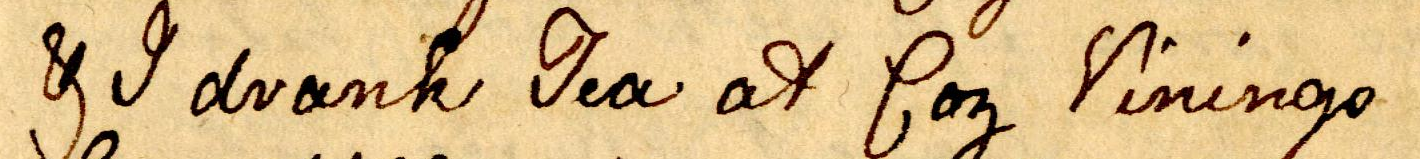& I drank Tea at Coz Vinings
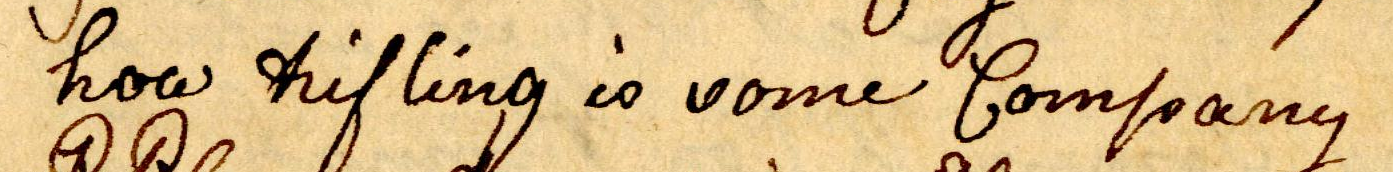how killing is some Company
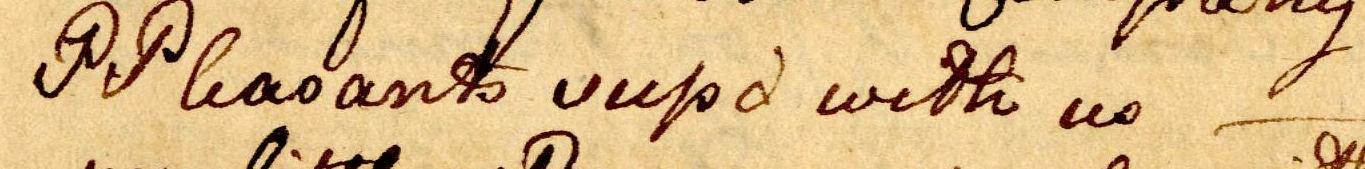P Pleasants supd with us-
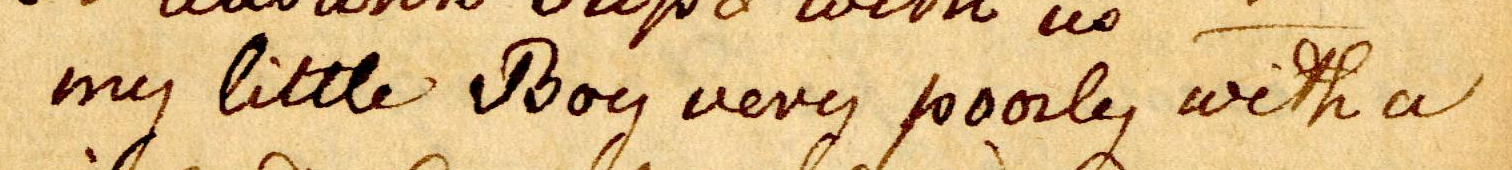my little Boy very poorly with a
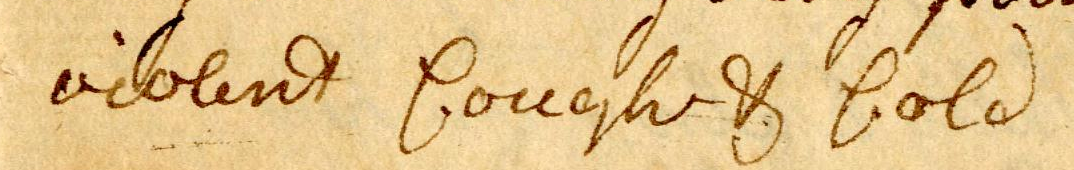violent Cough & Cold
